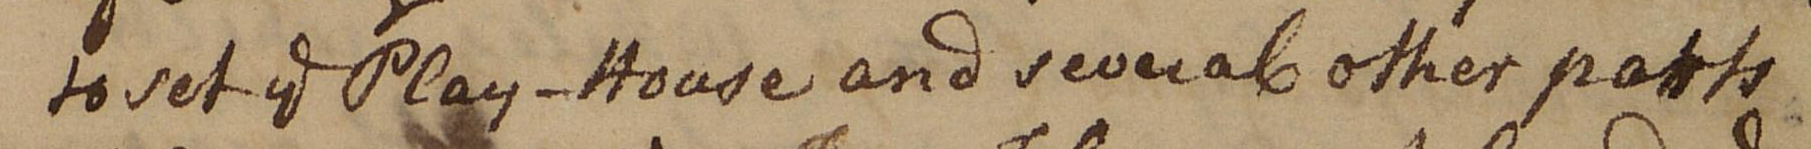to set y^e Play- House and several other parts
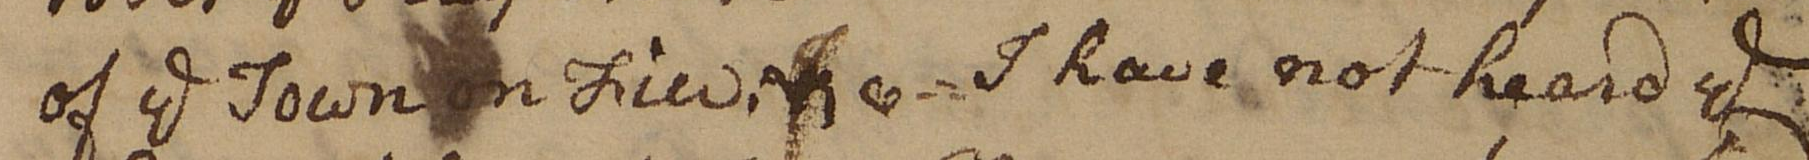of y^e Town on Fier. &c I have not heard y^e
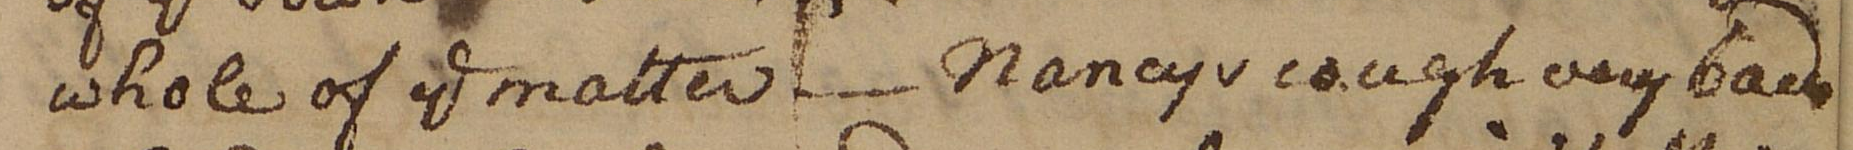whole of y^e matter- Nancys cough very bad
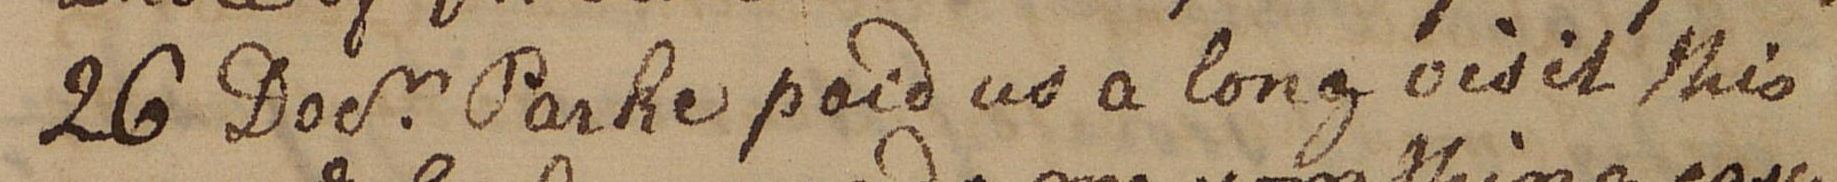26 Doc.^r Parke paid us a long visit this
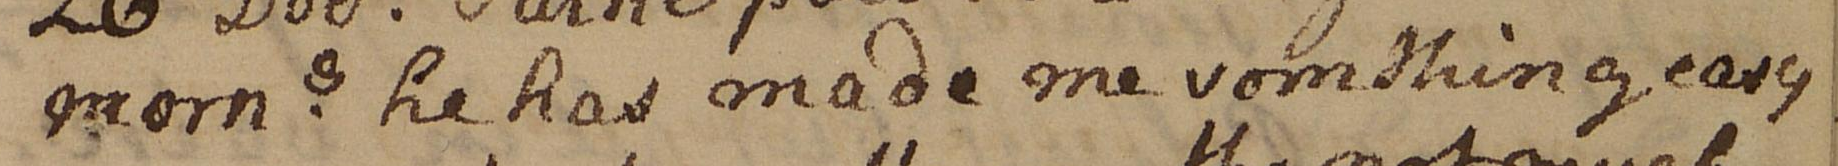morn.^g he has made me somthing easy
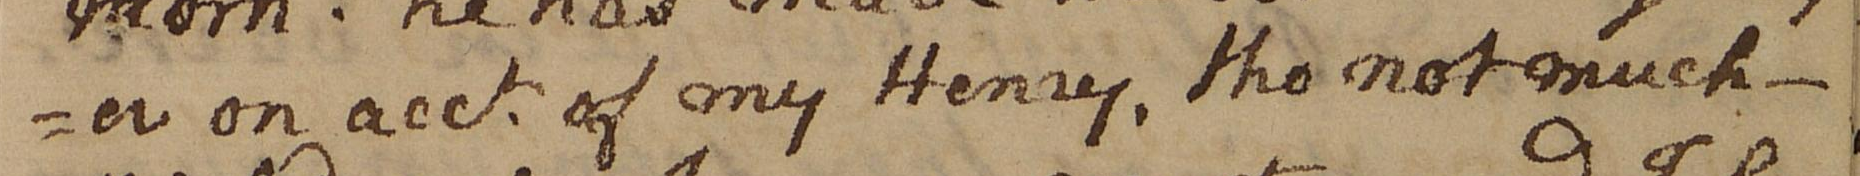-er on acc^t. of my Henry, tho not much-
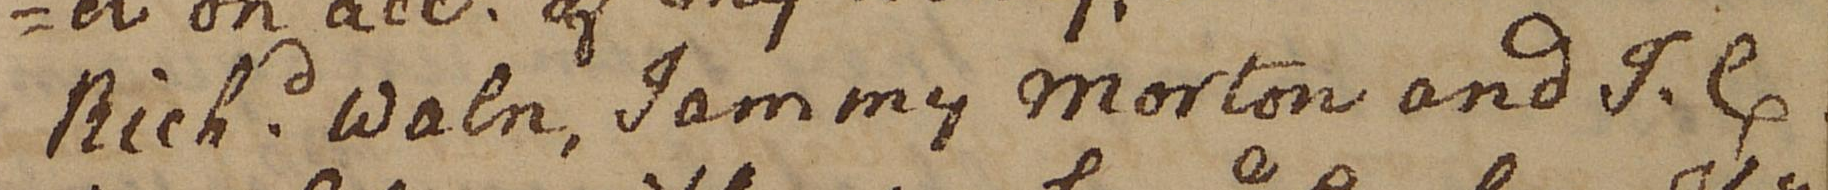Rich^d. Waln, Tammy Morton and J.C
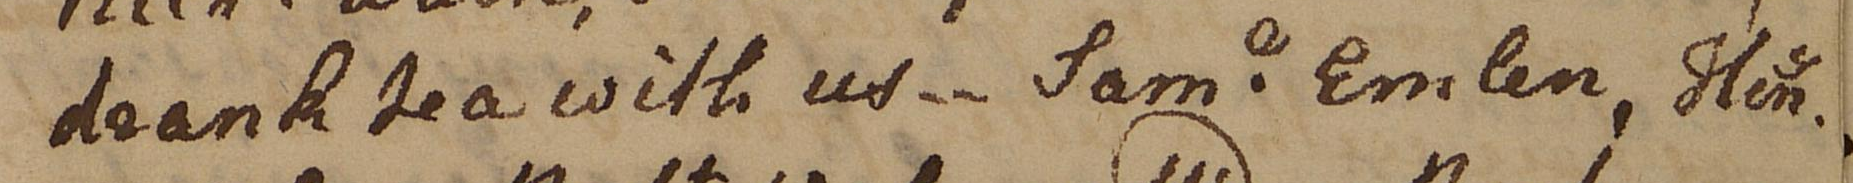drank tea with us- Sam^l. Emlen, Hen^y
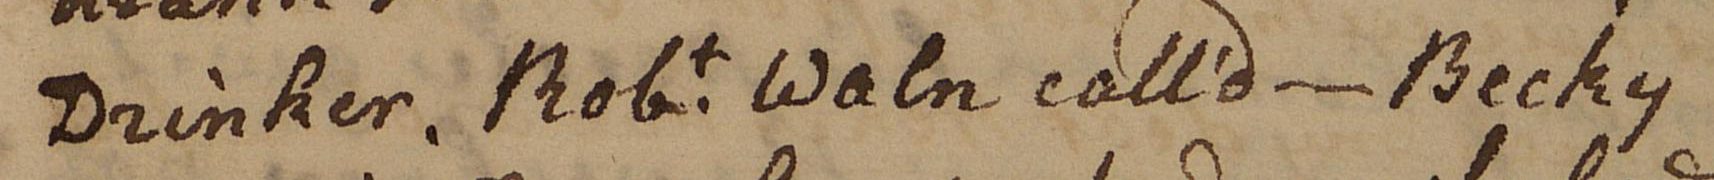Drinker, Rob^t. Waln call'd- Becky
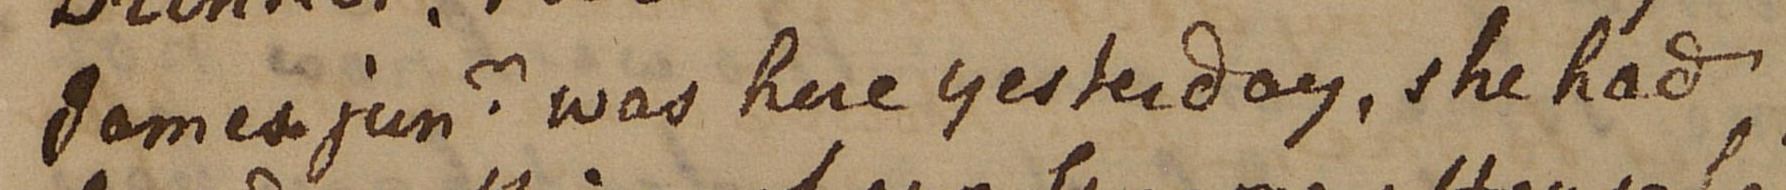James jun^r was here yesterday, she had
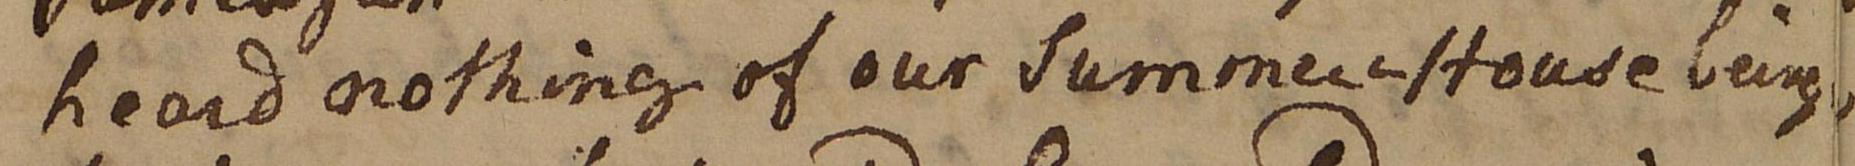heard nothing of our Summer-House being
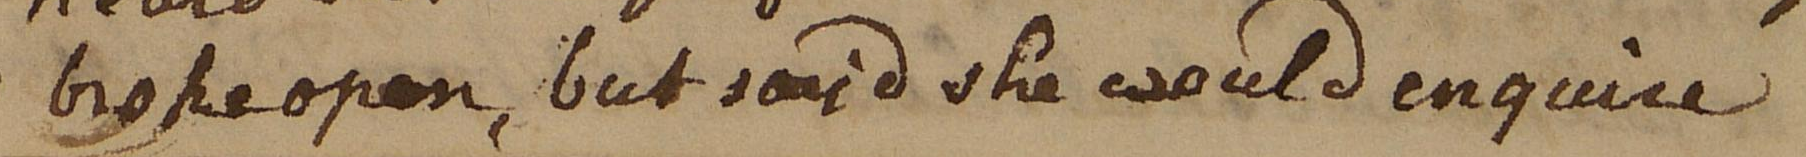broke open, but said she would enquire
